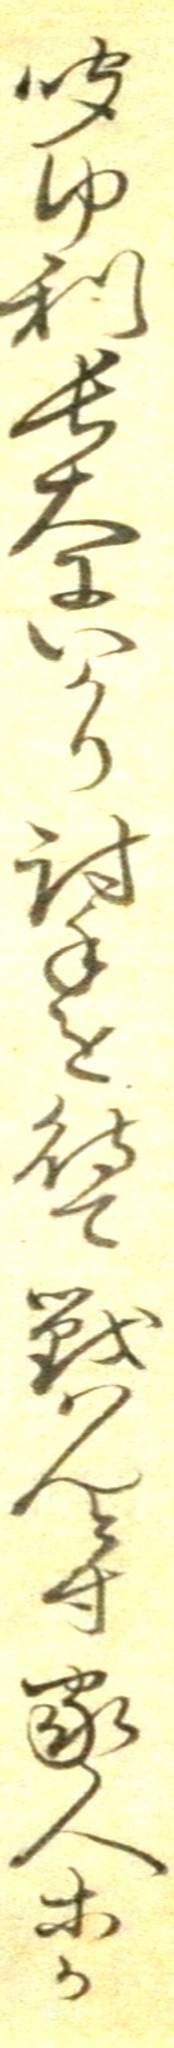聞ゆ利長大にいかり討手を待て戦はんとす家人等か
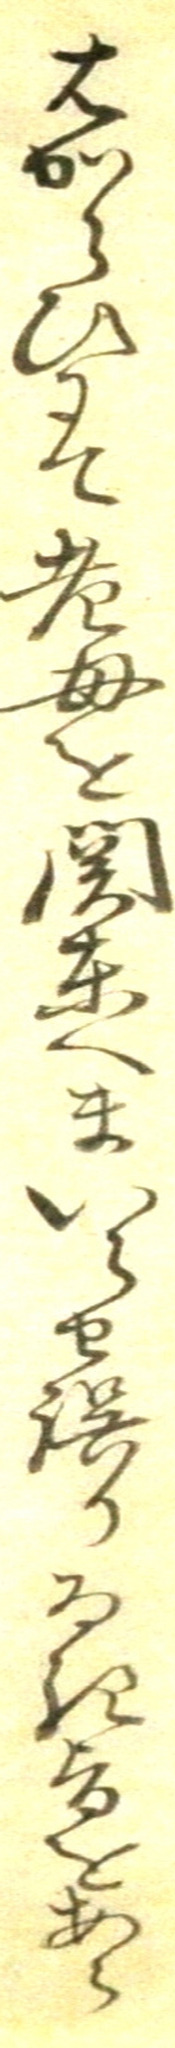はからひて老母を関東へまいらせ誤りなき旨をあら
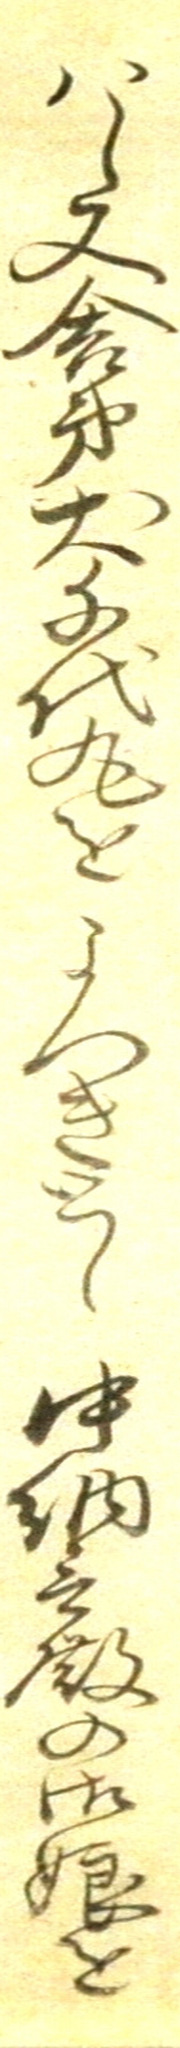はし又舎弟犬千代丸をよつきとし中納言殿の御娘を
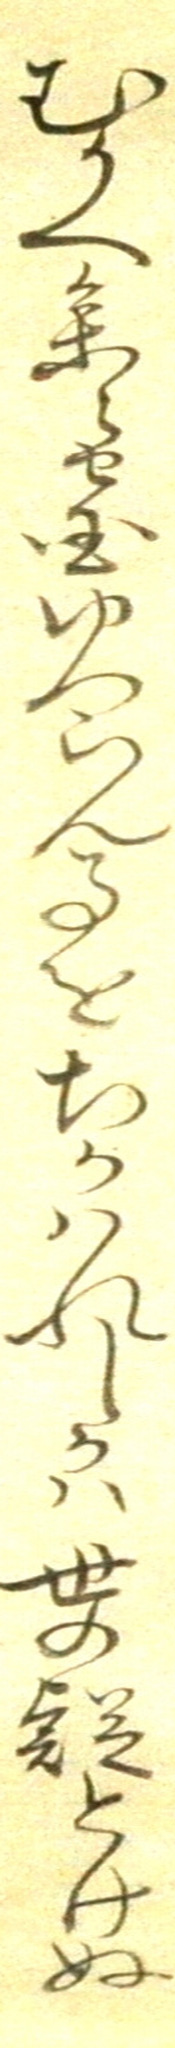むかへ参らせ国ゆつらん事をちかはれしかは世の疑とけぬ
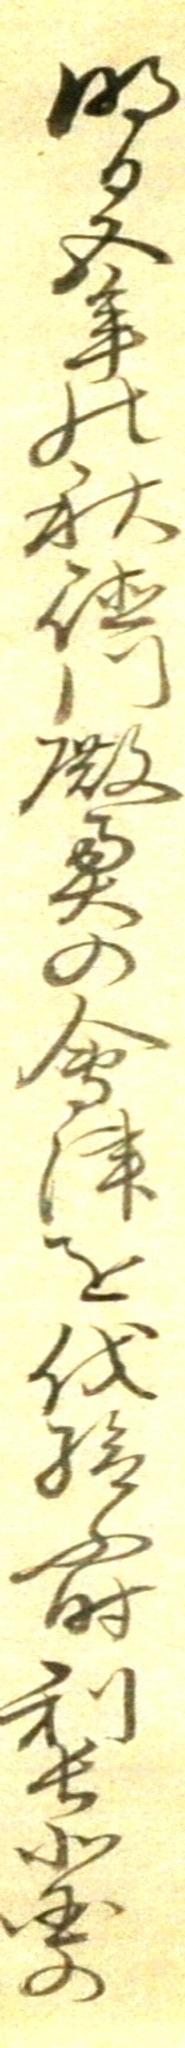明る五年の秋徳川殿奥の会津を伐給ふ時利長北国の
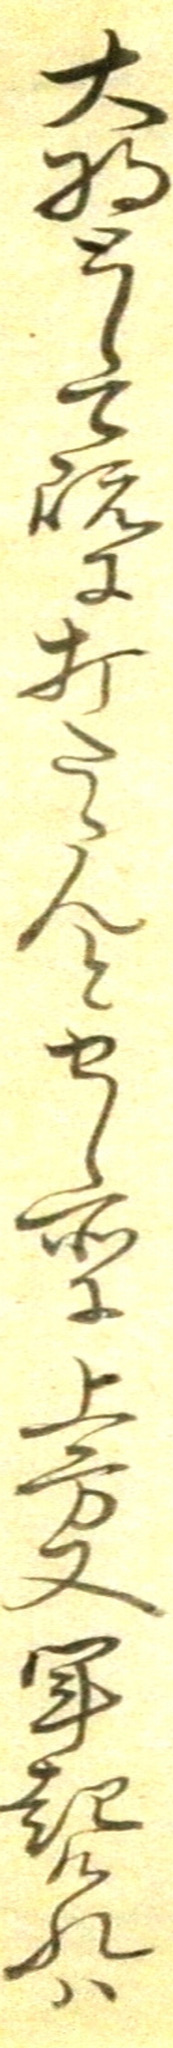大将として既に打たらんとせし所に上方又軍起けれは
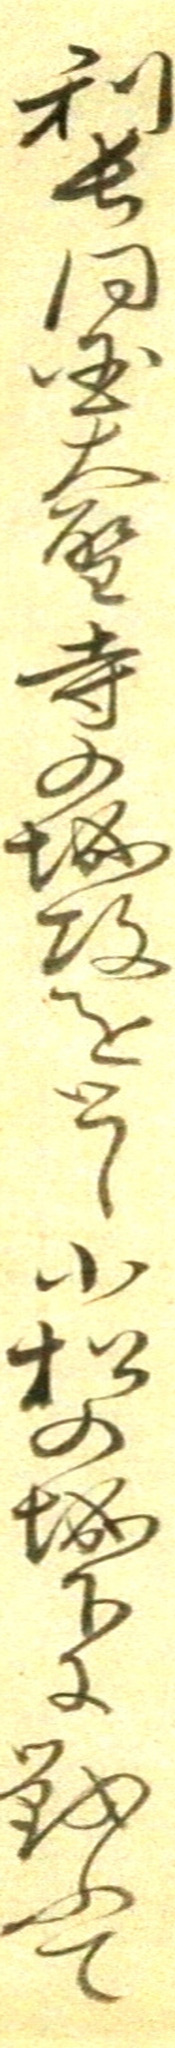利長同国大聖寺の城攻をとし小松の城下に戦ふて
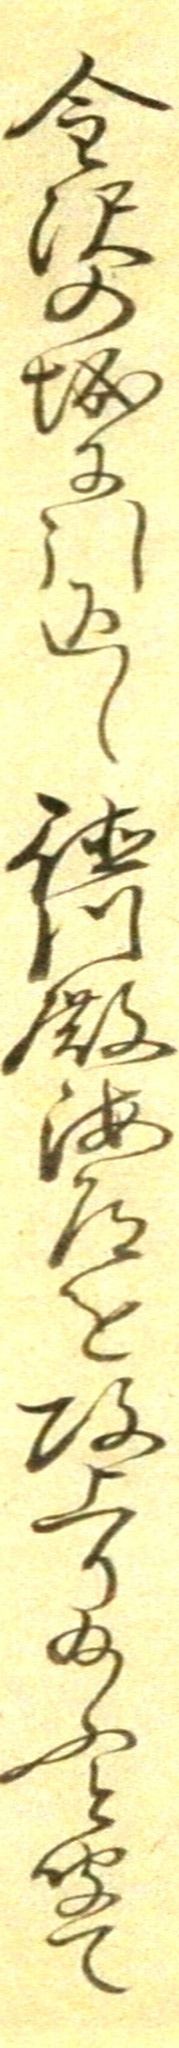金沢の城に引返し徳川殿海道を攻上り給ふと聞て
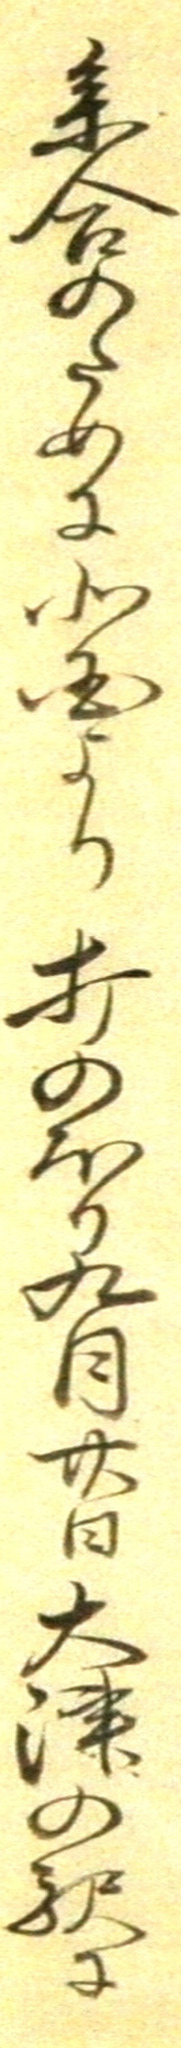参合のために北国より打のほり九月廿日大津の駅に
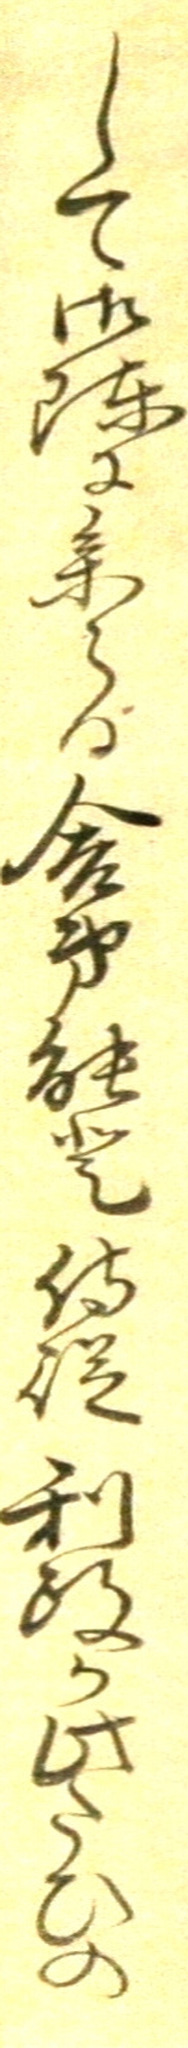して御陣に参らる舎弟能登侍従利政か此たひの

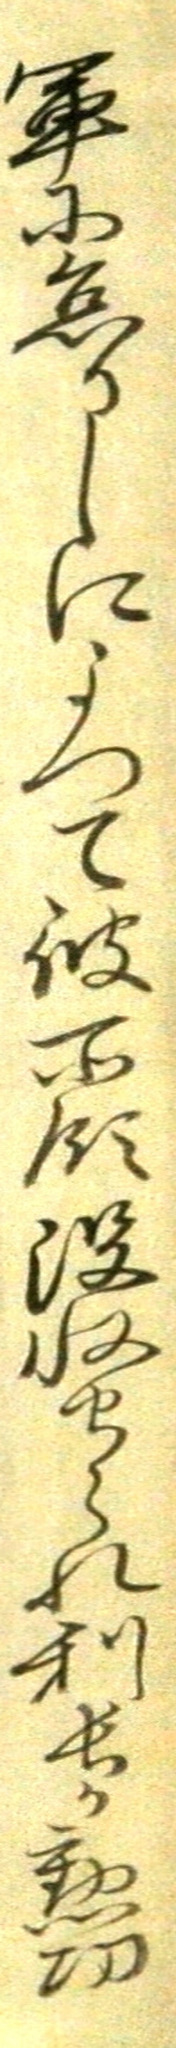軍に怠りしによつて彼所領没収せられ利長か勲功
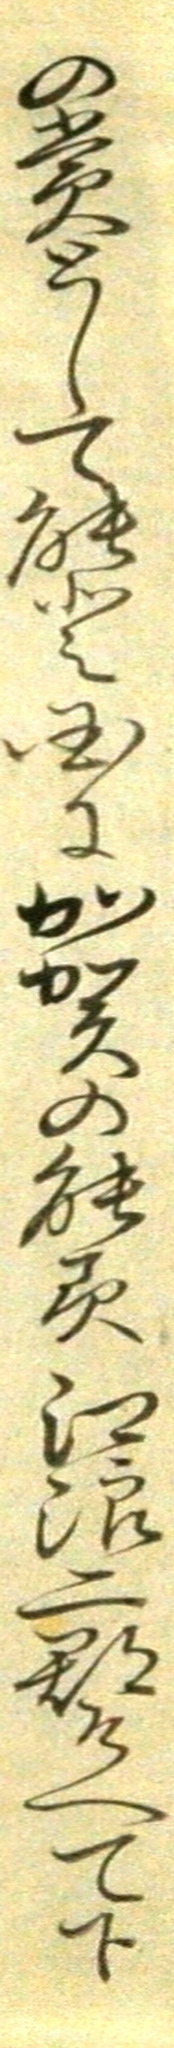の賞として能登国に加賀の能美江沼二郡そへて下
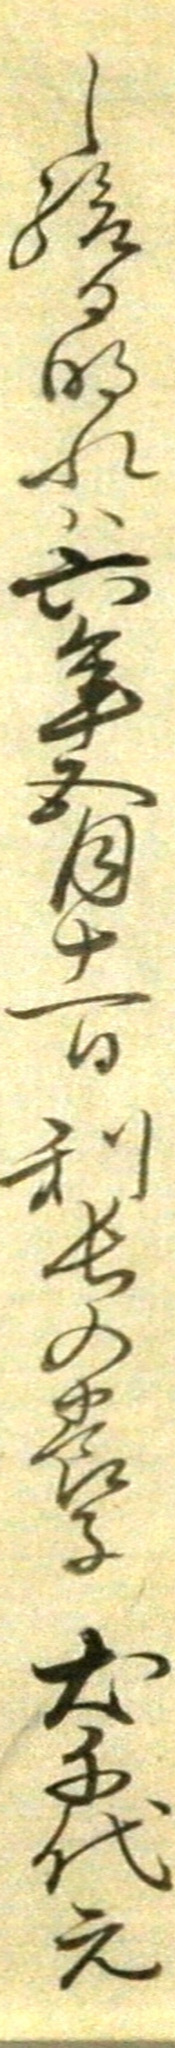し給る明れは六年五月十一日利長の養子犬千代元
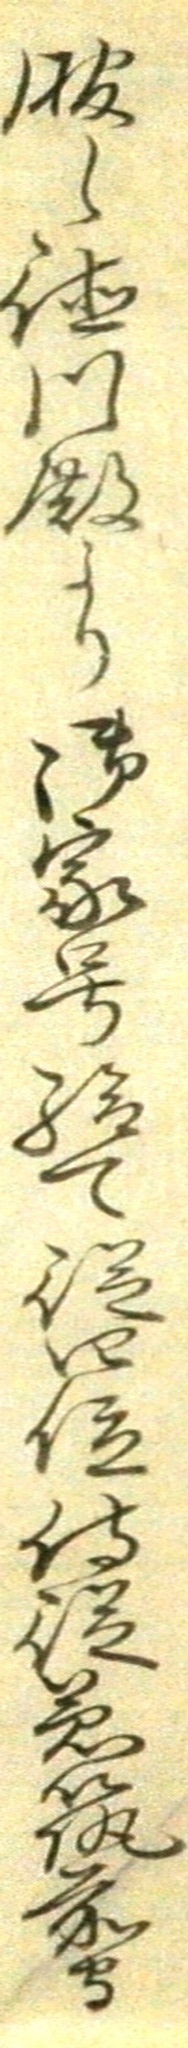服し徳川殿より御家号給て従四位侍従兼筑前守
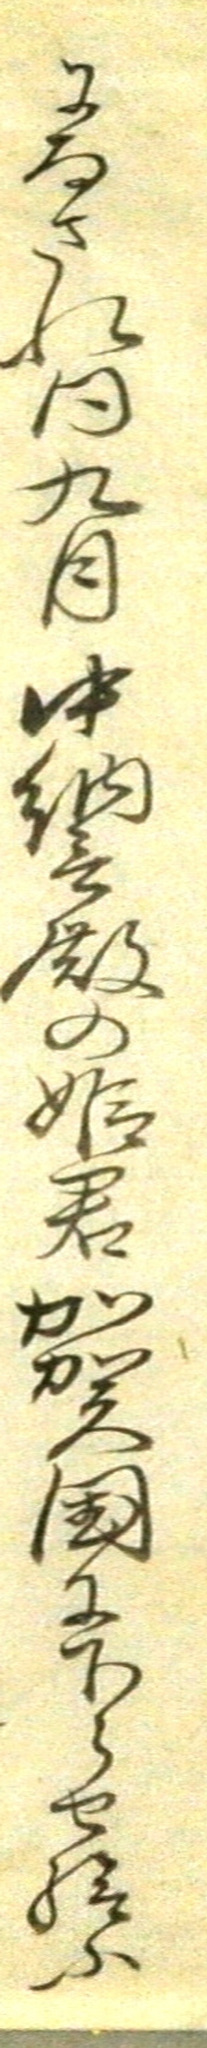になされ同九月中納言殿の姫君加賀国に下らせ給ふ
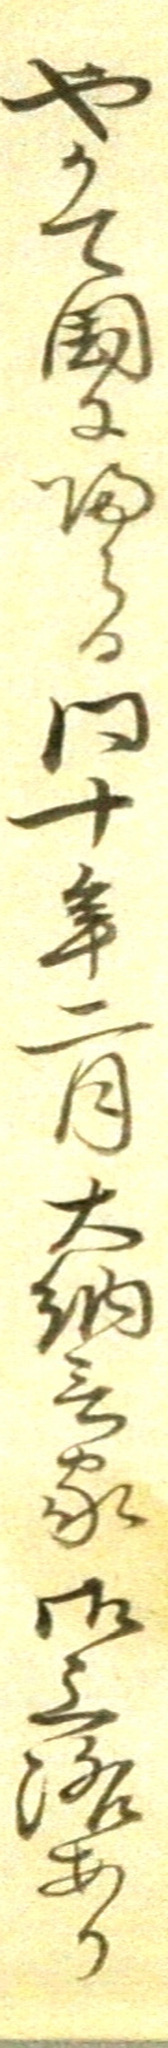やかて国に帰らる同十年二月大納言家御上洛あり
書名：藩翰譜（七・上）
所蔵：伊那市立高遠町図書館・合同会社AMANE
